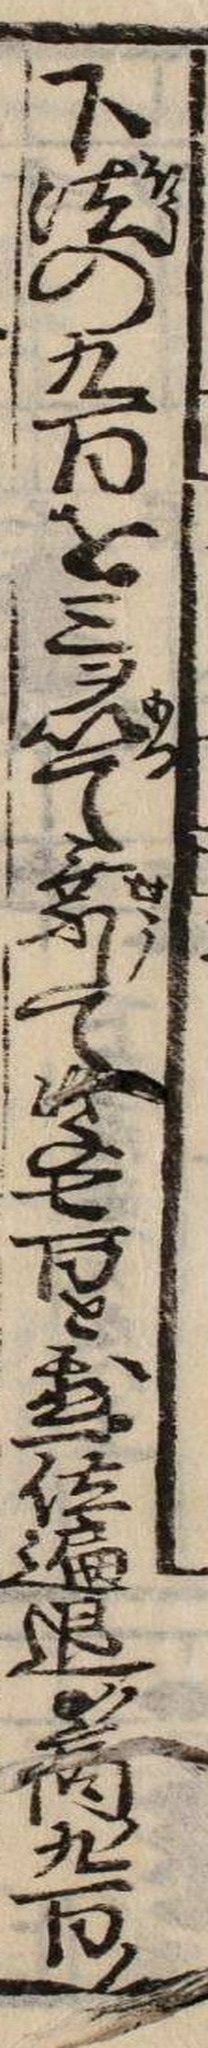下法の九百を三を以て乗して弐千七百と置一位遍退く商の九百の
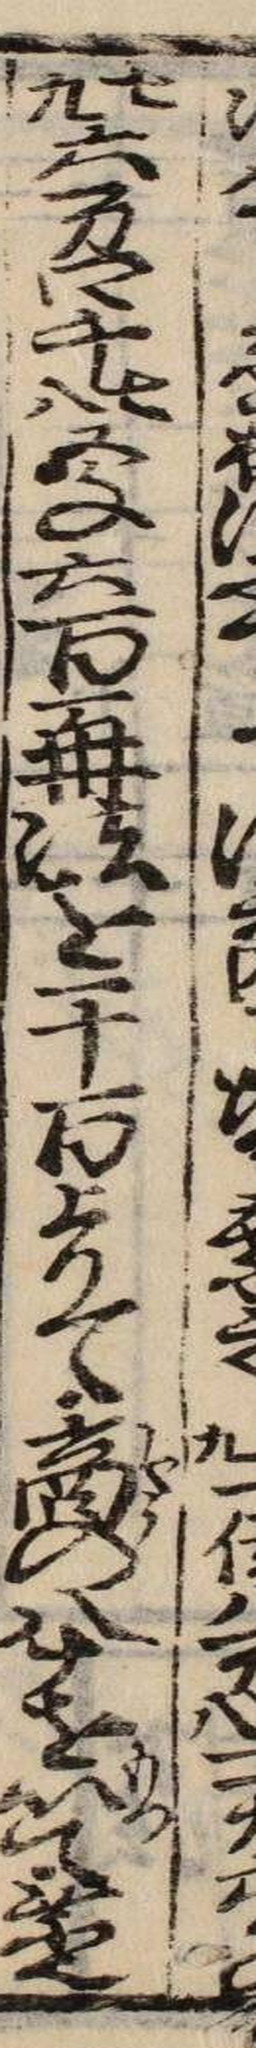[七九]六万四千[七八]五千六百再法を一十百上りて商の八十を以て乗之

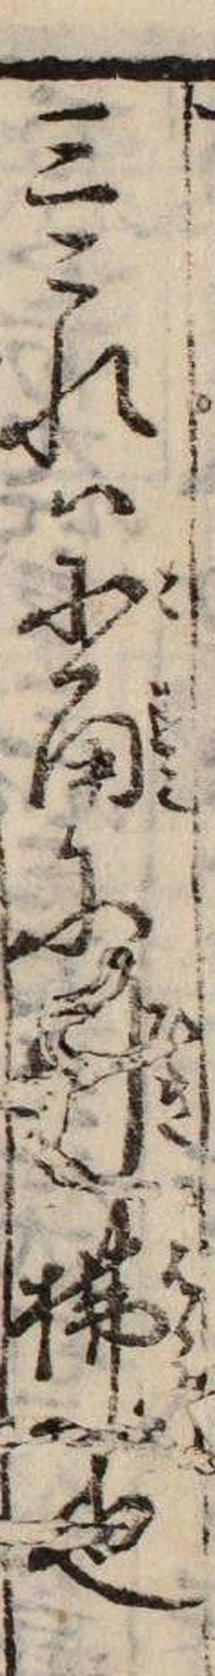三これは小角に引拂也
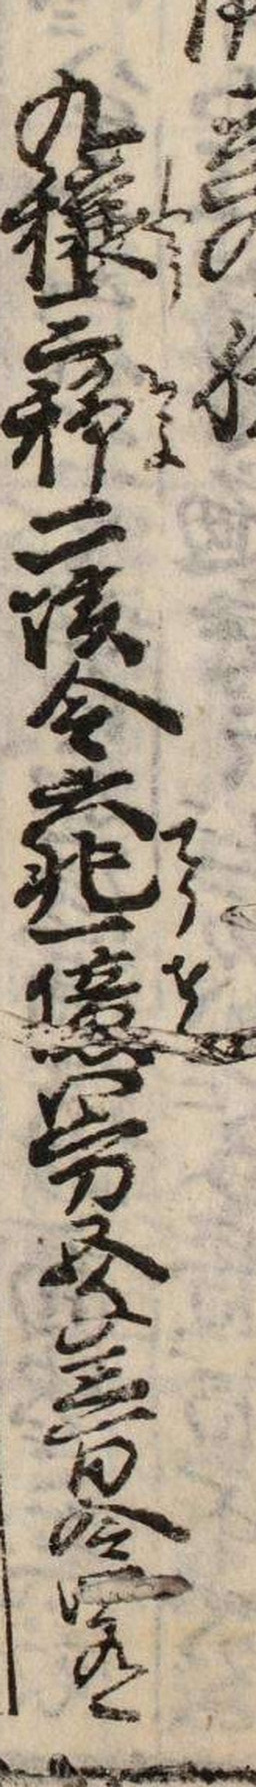九穰三杼二垓令六兆一億四万五千三百令四有
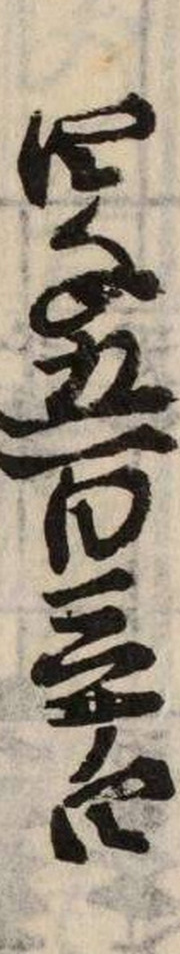四千五百三十四
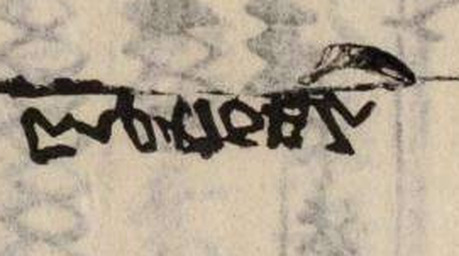四千五百三十四

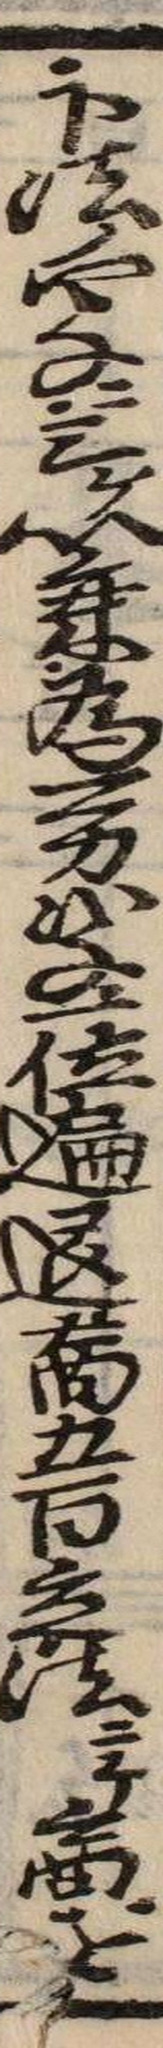下法の四千に三を以乗為一万弐千一位遍退商五百立法にて商を

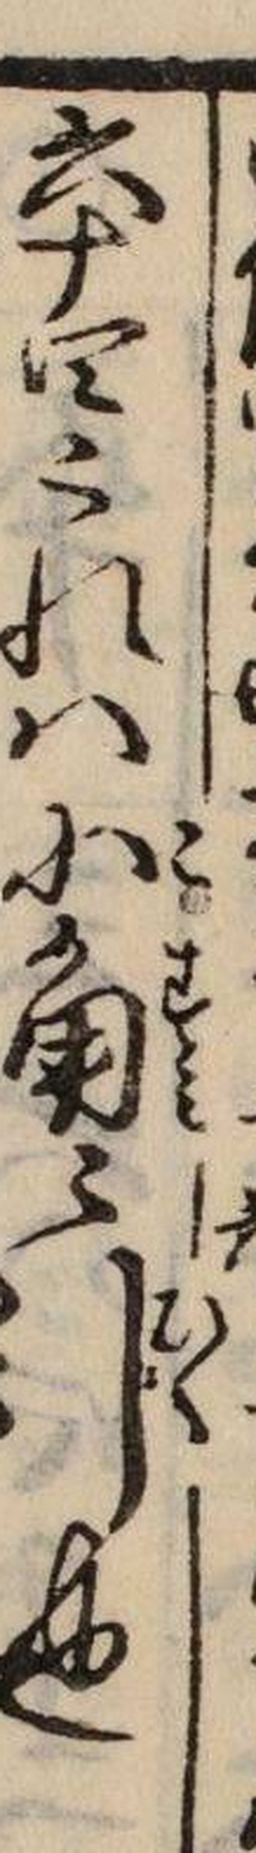六十四これは小角に引也
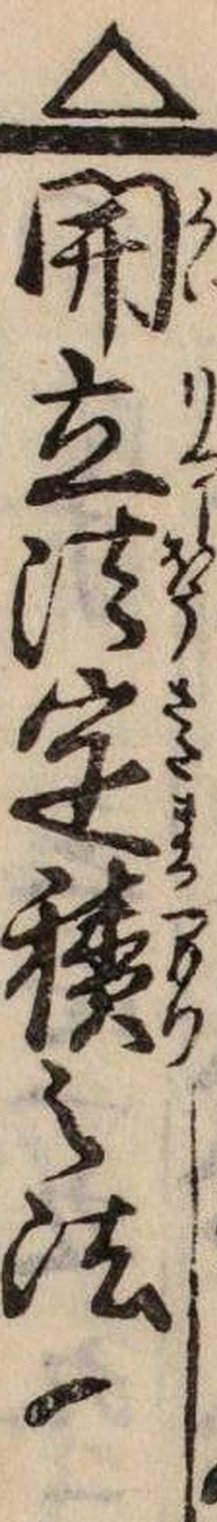△開立法定積之法
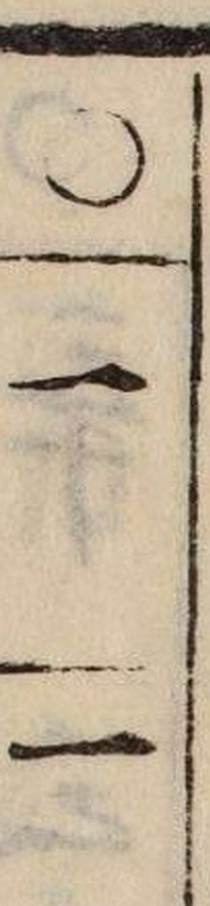○一一
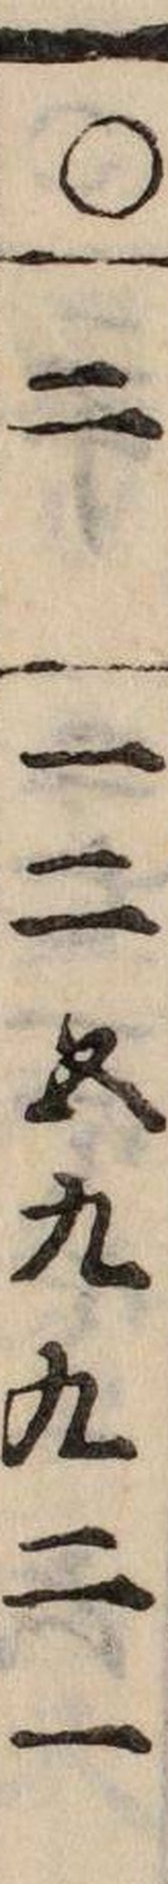○二一二五九九二一
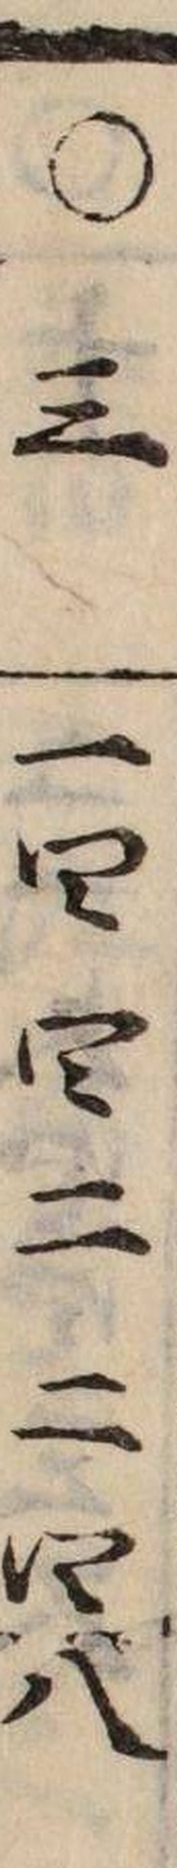○三一四四二二四八
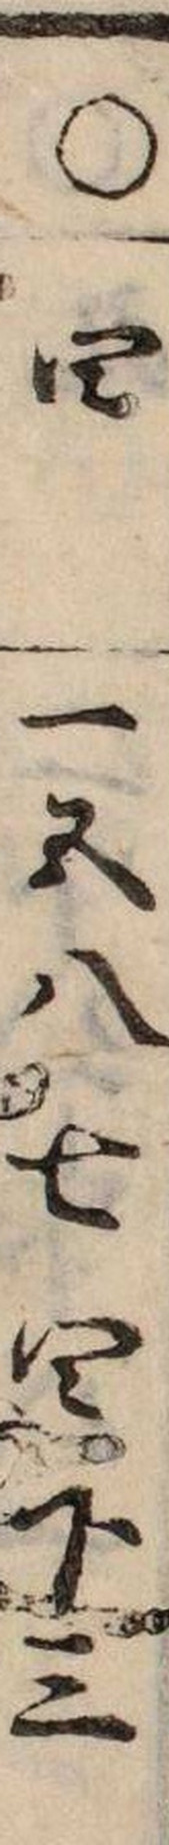○四一五八七四下三
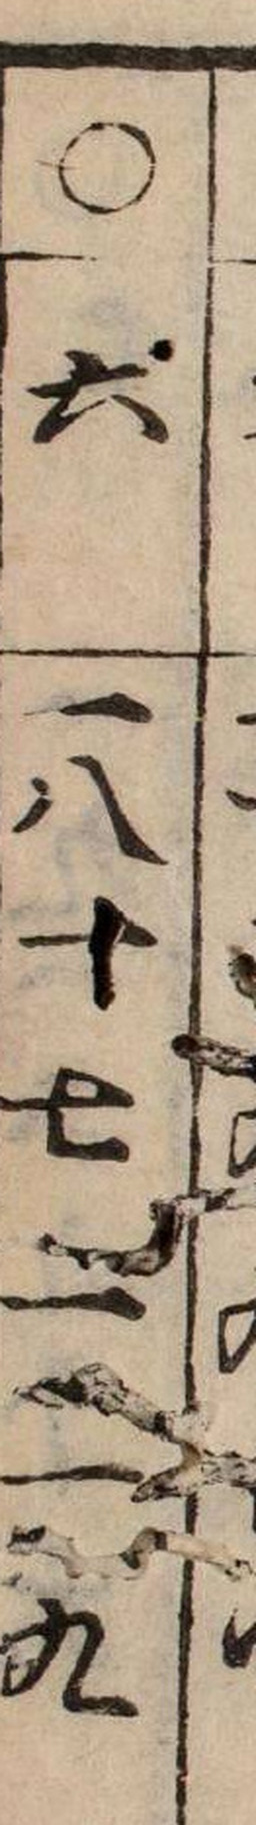○六一八一七一一九

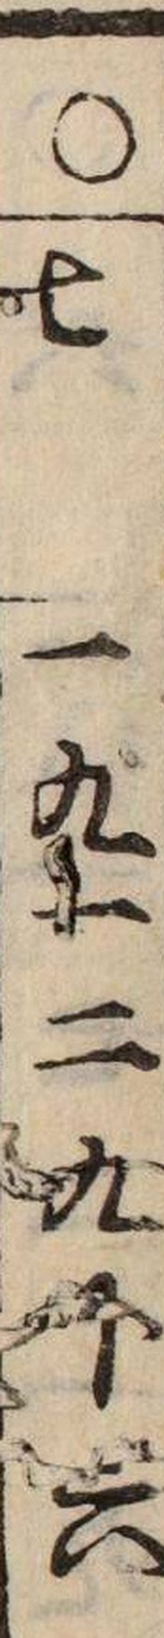○七一九一二九下六
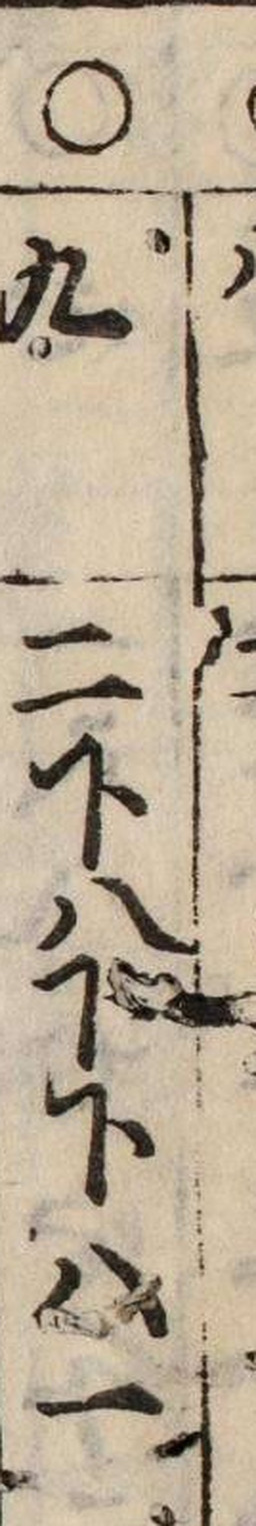○九二下八下下八一
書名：塵劫記（寛永11年自跋、京都府立京都学・歴彩館追貴8）
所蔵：京都府立京都学・歴彩館 国文学研究資料館
